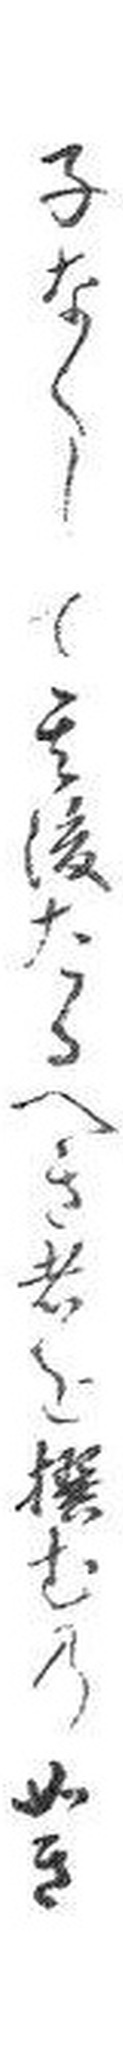子なくして其後たるへき者を撰むの如き
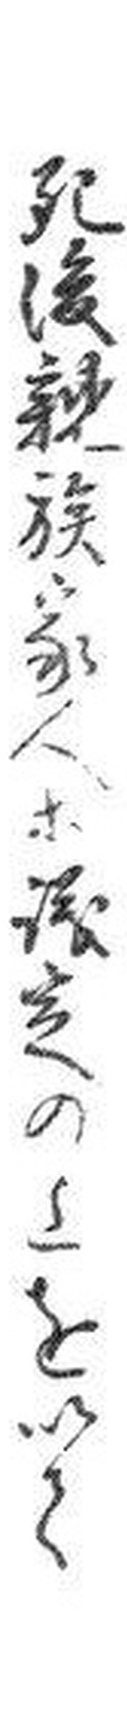死後親族家人等議定の上を以て
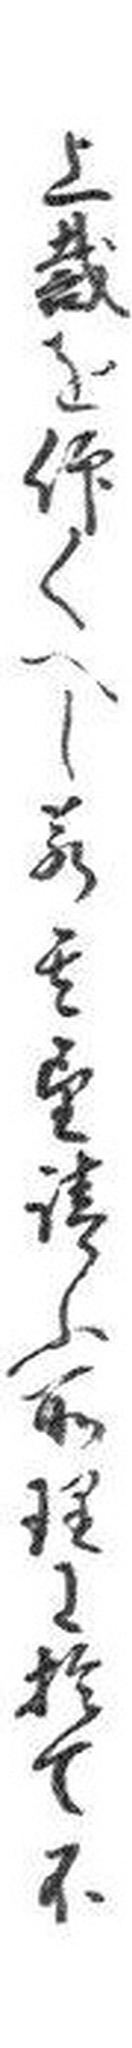上裁を仰くへし若其望請ふ所理に於て不
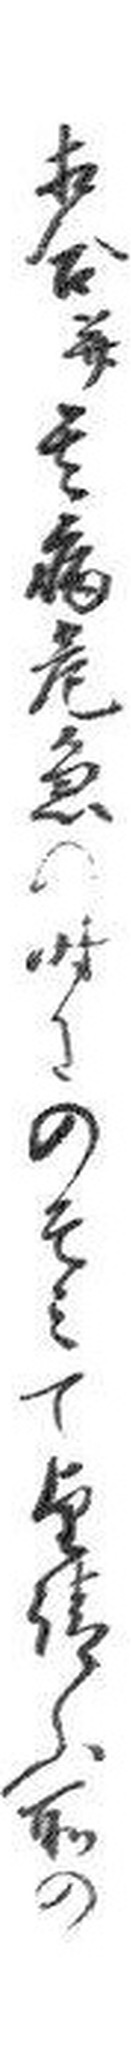相合幷其病危急の時にのそみて望請ふ所の
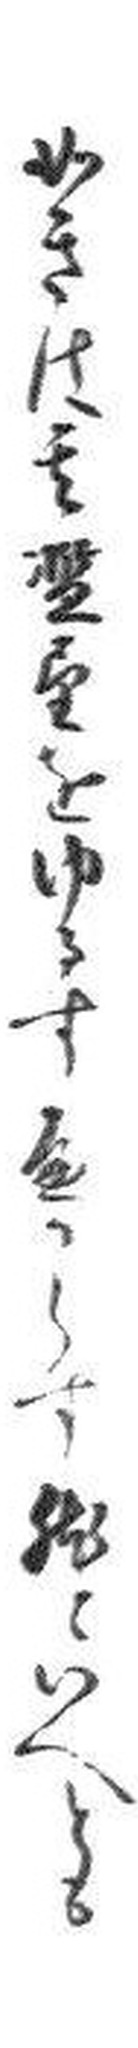如きは其濫望をゆるすへからす然といへとも
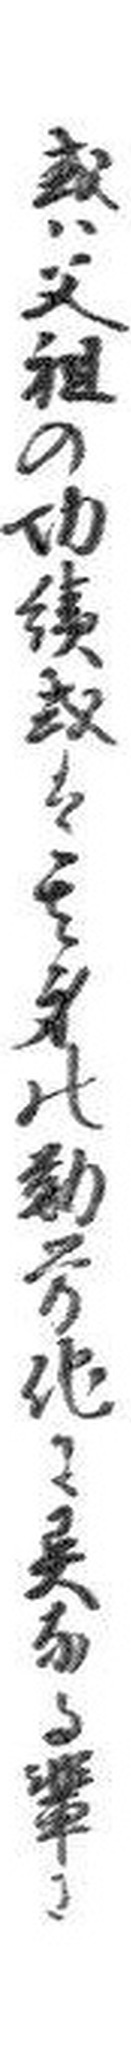或は父祖の功績或は其身の勤労他に異なる輩に
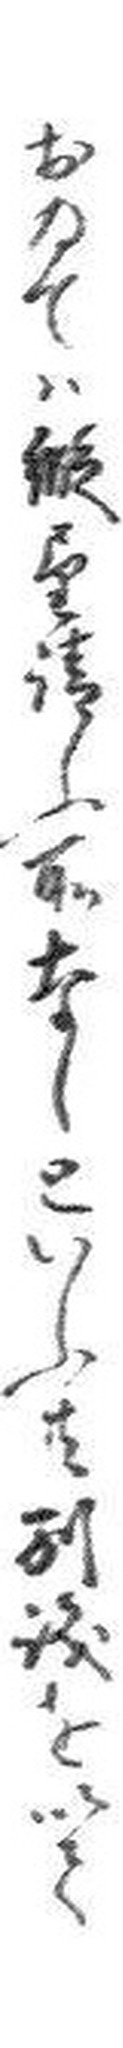おゐては仮望請ふ所なしといふ共別議を以て
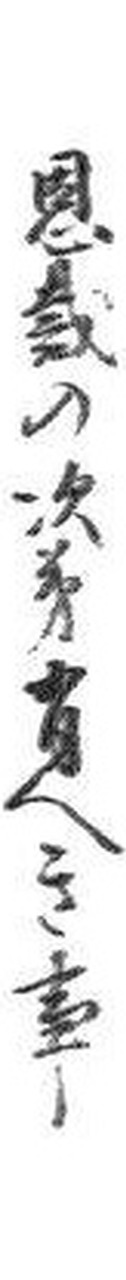恩裁の次第有へき事
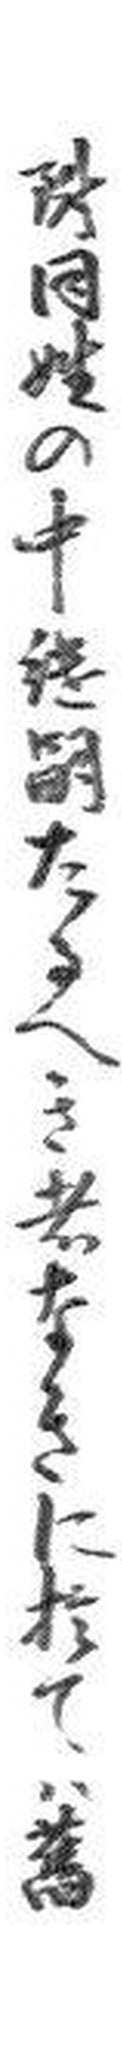附同姓の中継嗣たるへき者なきに於ては旧
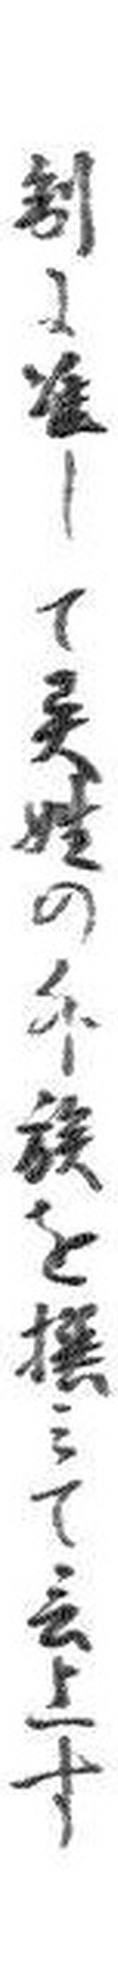制に准して異姓の外族を撰みて言上す
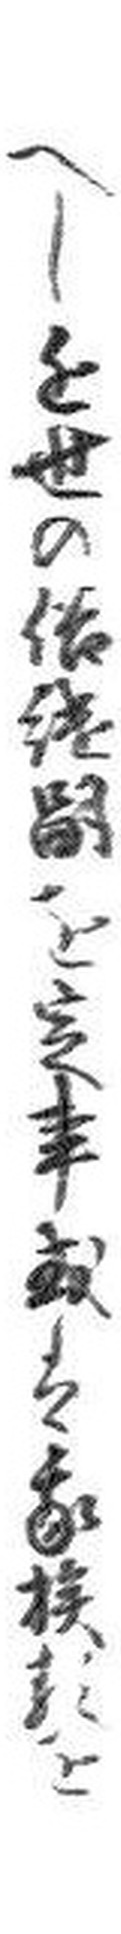へし近世の俗継嗣を定事或は我族類を
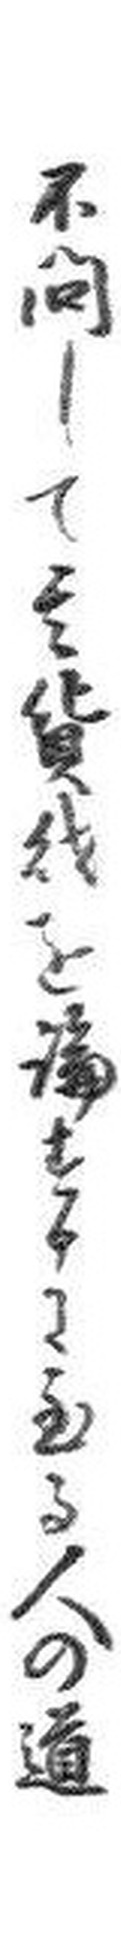不問して其貨財を論するに至る人の道
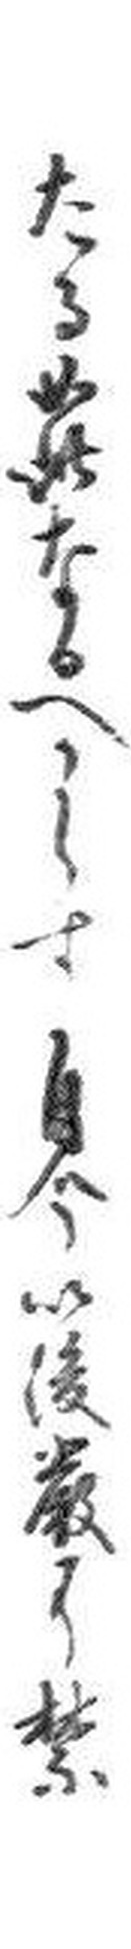たる如此なるへからす自今以後厳に禁

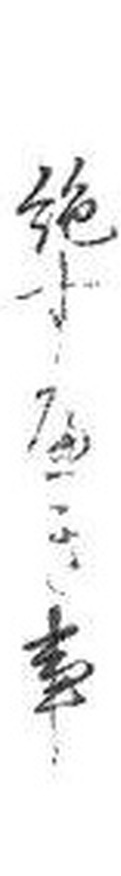絶すへき事
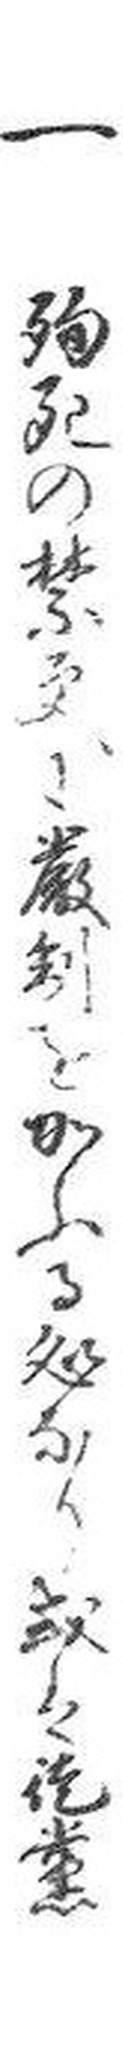一殉死の禁更に厳制を加ふる処なり或は徒党
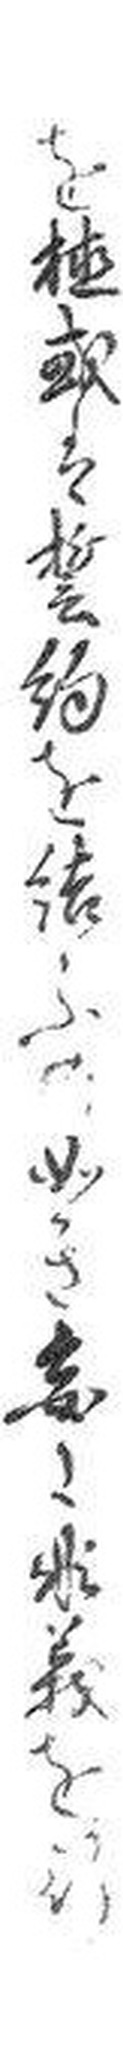を植或は誓約を結ふの如き妄に非義を行
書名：家譜 二十五 吉品公 従宝永六年到同七年
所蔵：福井県文書館 Fukui Prefectural Archives
